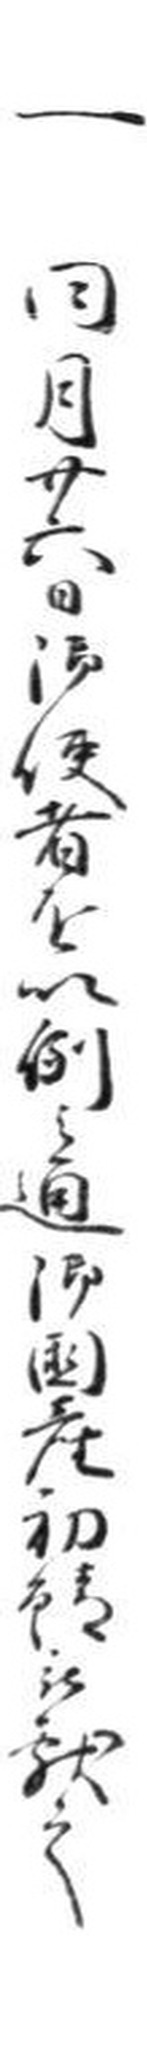一同月廿六日御使者を以例之通御国産初鯖被献之
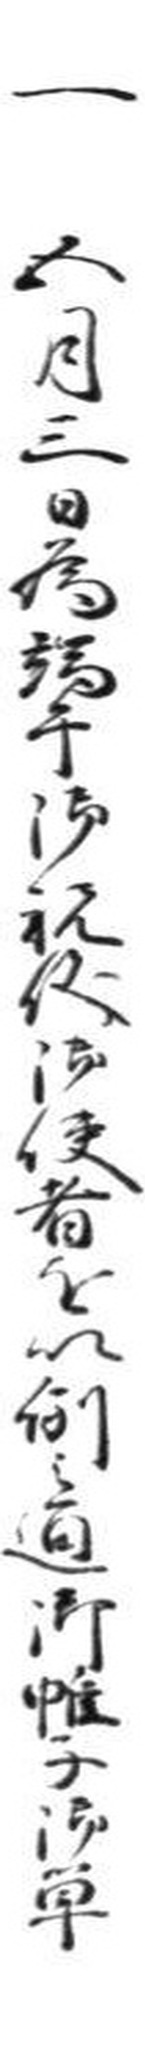一五月三日為端午御祝儀御使者を以例之通御帷子御単
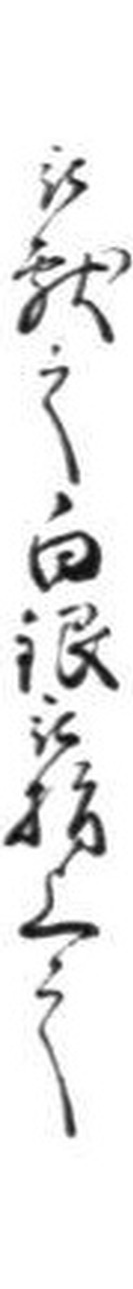被献之白銀被指上之
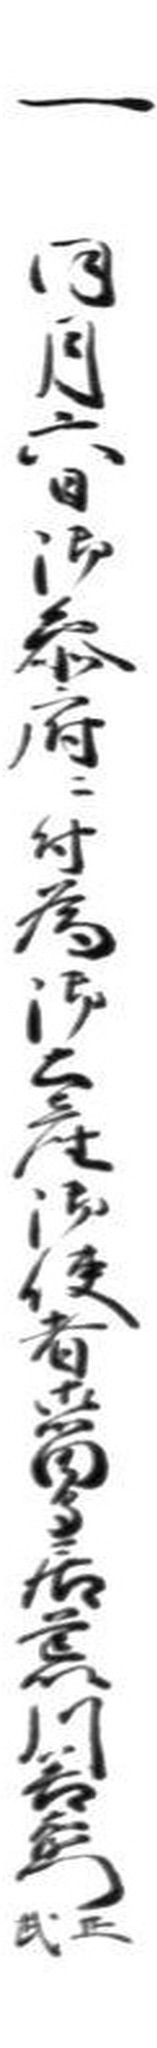一同月六日御参府ニ付為御土産御使者御留守居荒川善右衛門正武
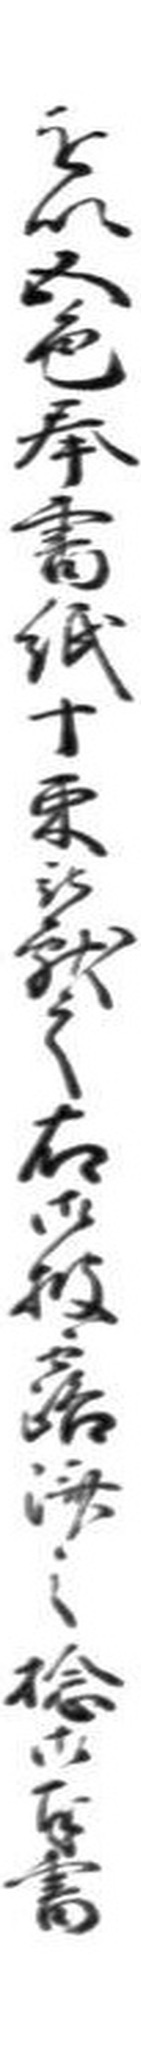を以五色奉書紙十束被献之右御披露済之捻御奉書
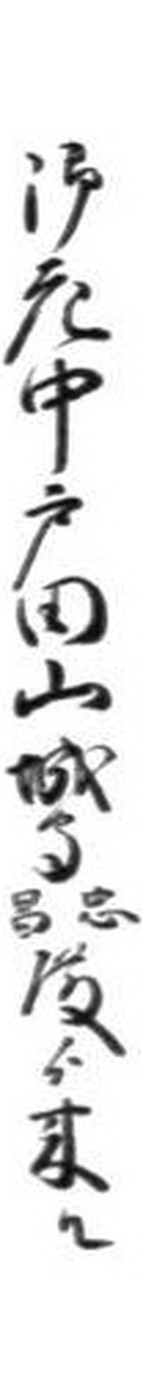御老中戸田山城守忠昌殿ゟ来ル
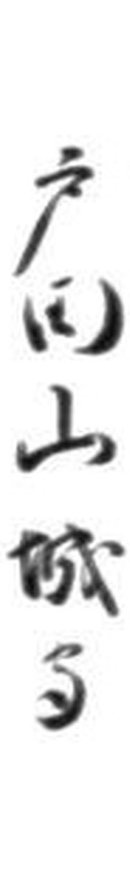戸田山城守
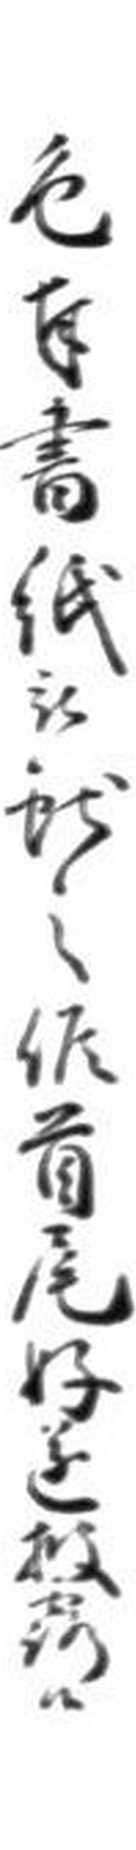色奉書紙被献之候首尾好遂披露候
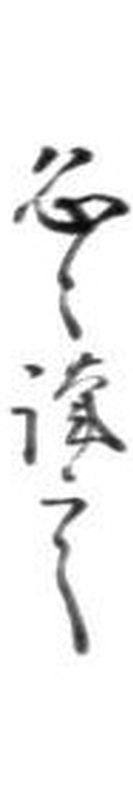恐々謹言

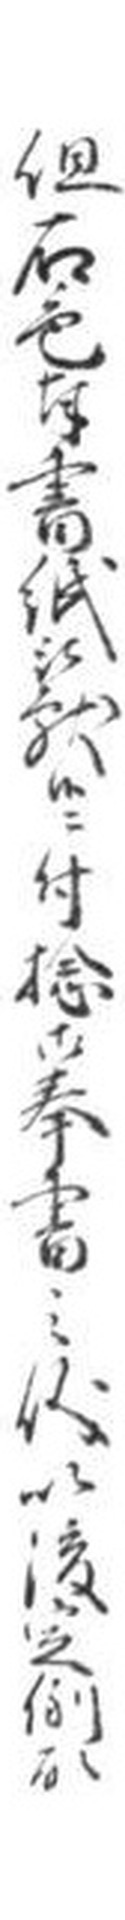但右色奉書紙被献候ニ付捻御奉書之儀以後定例故
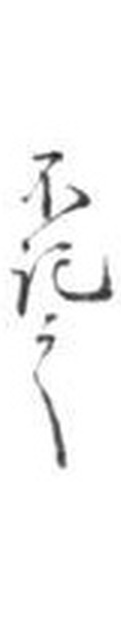不記之
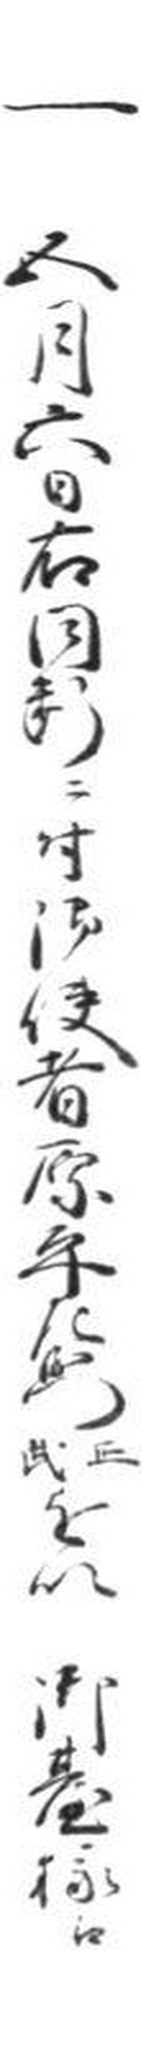一五月六日右同断ニ付御使者原平左衛門正武を以
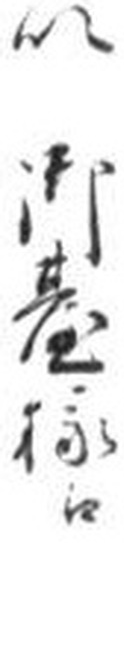御台様江
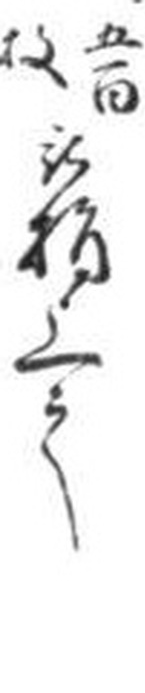被指上之
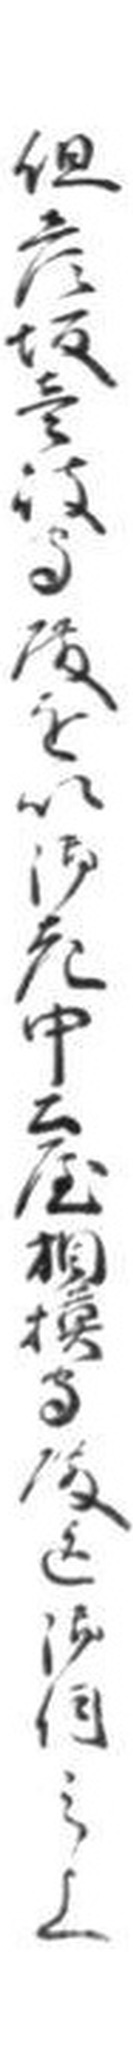但彦坂壱岐守殿を以御老中土屋相模守殿迄御伺之上
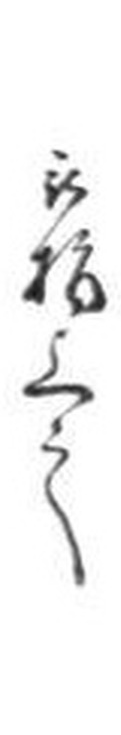被指上之
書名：家譜 十七 吉品公 従元禄元年到同二年
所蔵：福井県文書館 Fukui Prefectural Archives
